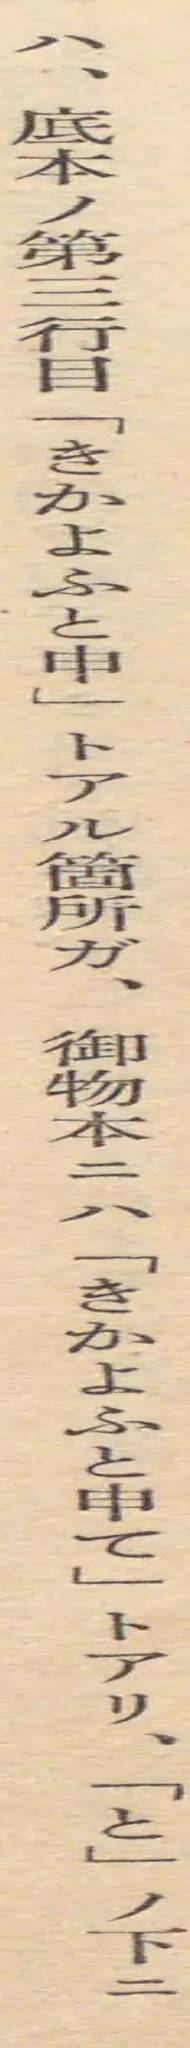ハ、底本ノ第三行目「きかよふと申」トアル箇所ガ、御物本ニハ「きかよふと申て」トアリ、「と」ノ下ニ
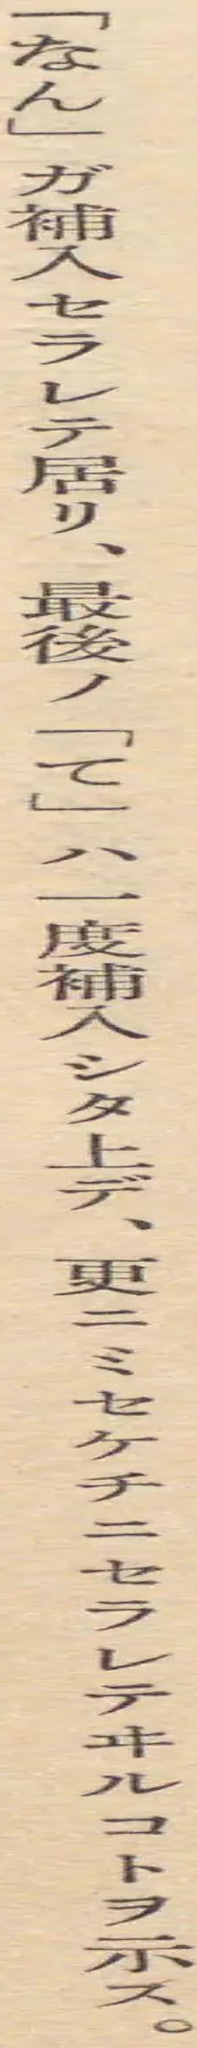「なん」ガ補入セラレテ居リ、最後ノ「て」ハ一度補入シタ上デ、更ニミセケチニセラレテヰルコトヲ示ス。
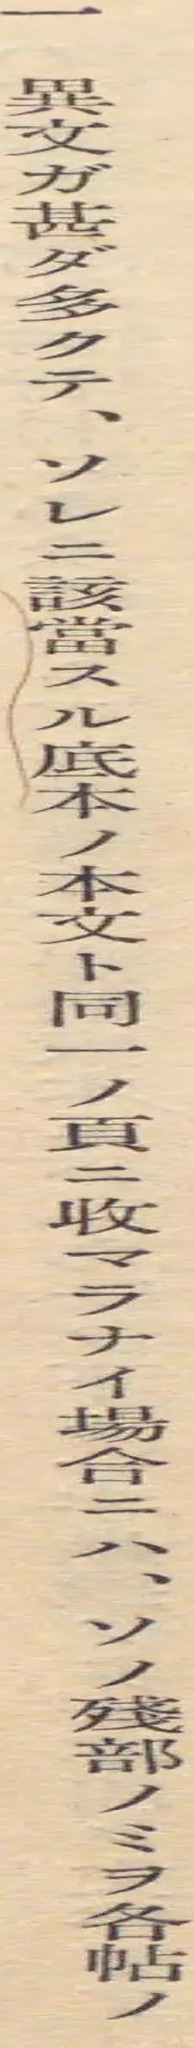一異文ガ甚ダ多クテ、ソレニ該当する底本ノ本文ト同一ノ頁ニ収マラナイ場合ニハ、ソノ残部ノミヲ各帖ノ
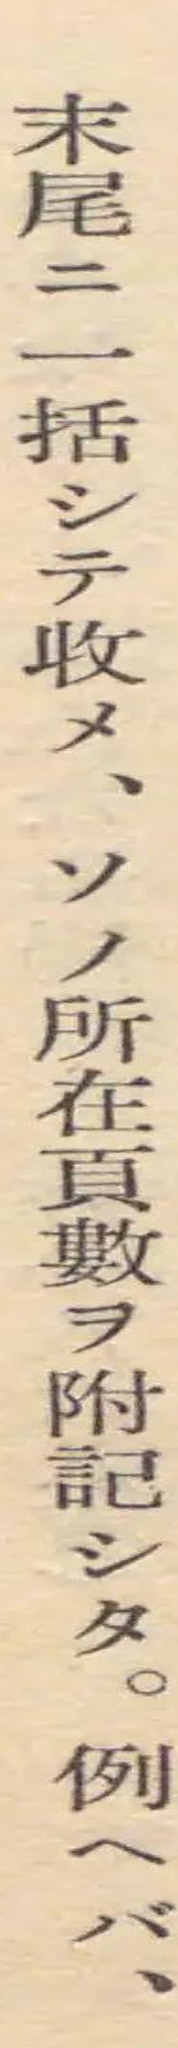末尾ニ一括シテ収メ、ソノ所在頁数ヲ附記シタ。例ヘバ、
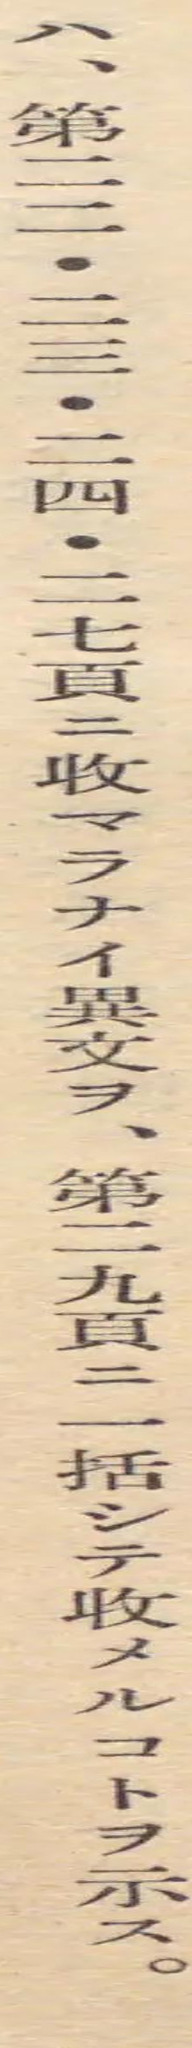ハ、第二二・二三・二四・二七頁ニ収マラナイ異文ヲ、第二九頁ニ一括シテ収メルコトヲ示ス。
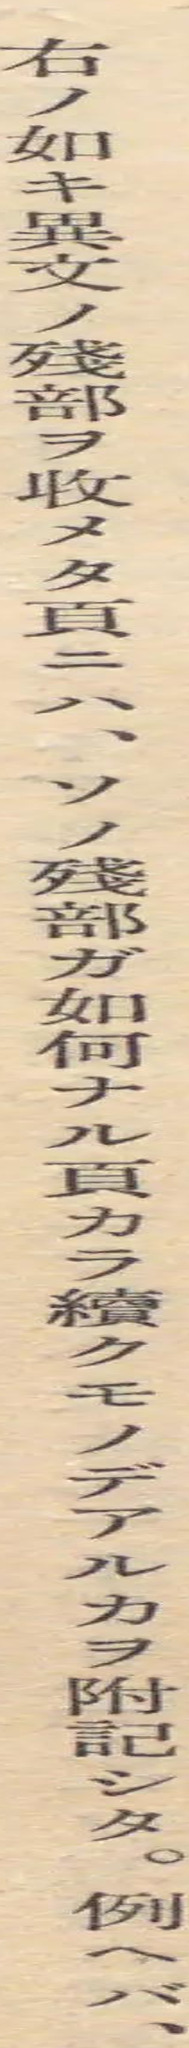右ノ如キ異文ノ残部ヲ収メタ頁ニハ、ソノ残部ガ如何ナル頁カラ続クモノデアルカヲ附記シタ。例ヘバ、
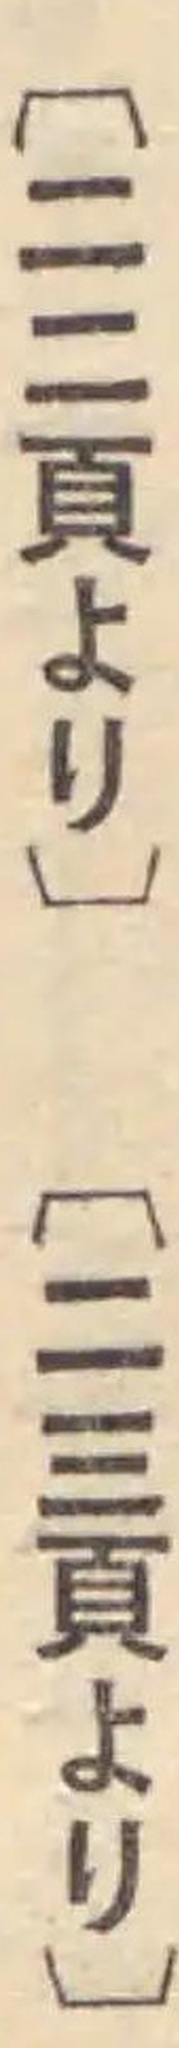[二二頁より][二三頁より]
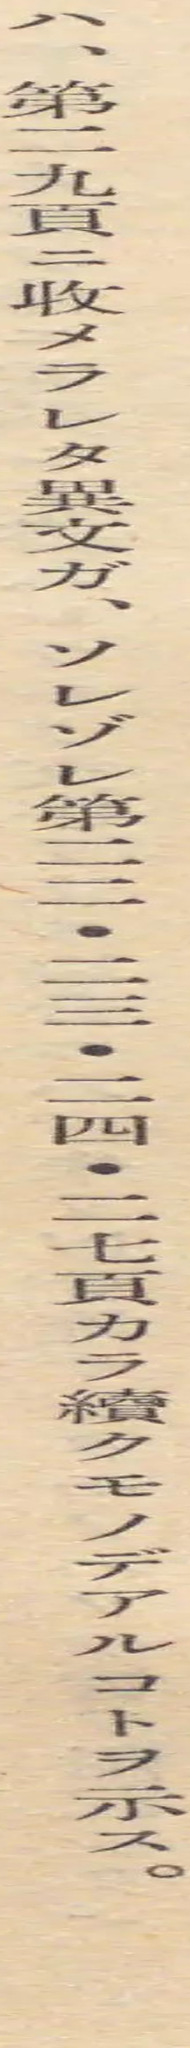ハ、第二九頁ニ収メラレタ異文ガ、ソレゾレ第二二・二三・二四・二七頁カラ続クモノデアルコトヲ示ス。
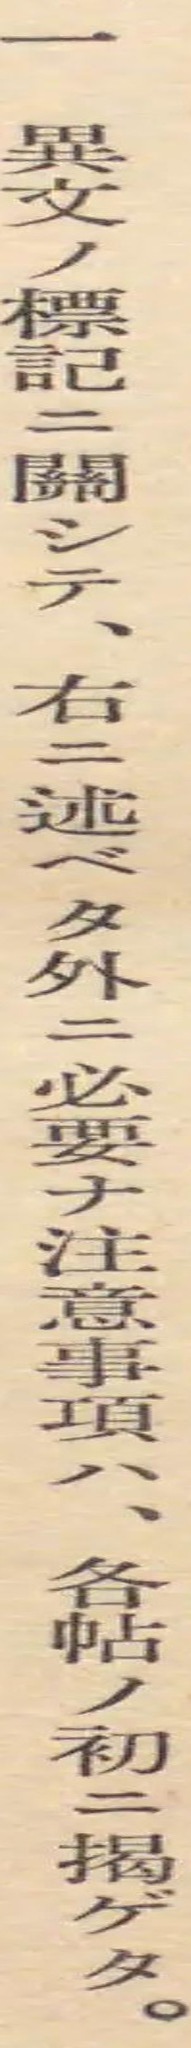一異文ノ標記ニ関シテ、右ニ述ベタ外ニ必要ナ注意事項ハ、各帖ノ初ニ掲ゲタ。

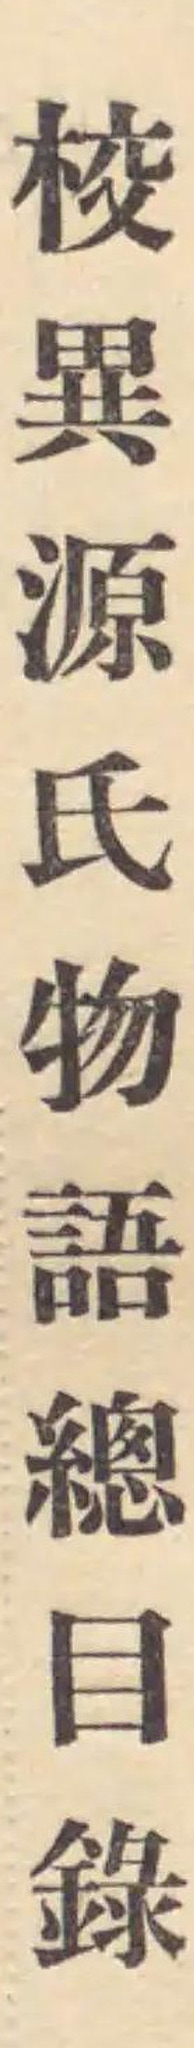校異源氏物語総目録

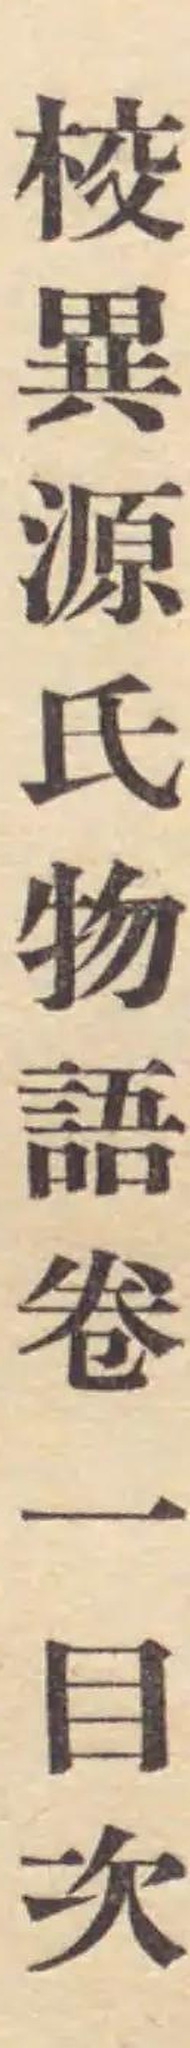校異源氏物語巻一目次
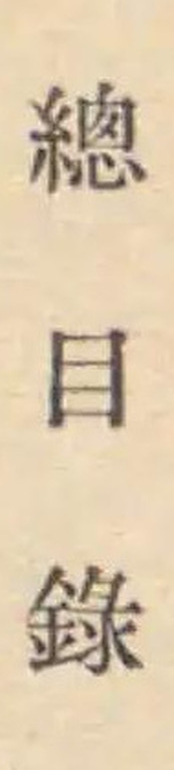総目録

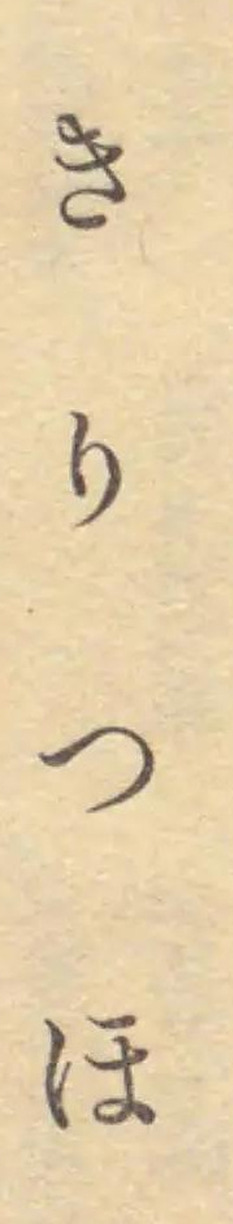きりつほ

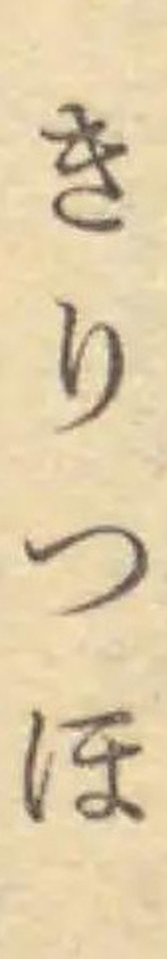きりつほ
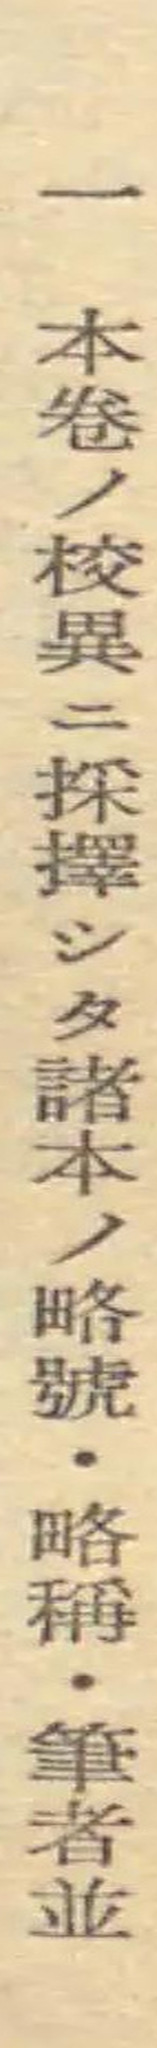一本巻ノ校異ニ採択シタ諸本ノ略号・略称・筆者並
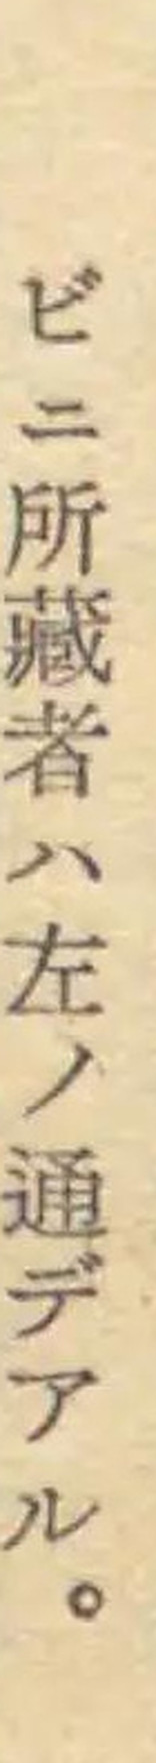ビニ所蔵者ハ左ノ通デアル。
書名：校異源氏物語.
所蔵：国立国会図書館 National Diet Library, JAPAN
